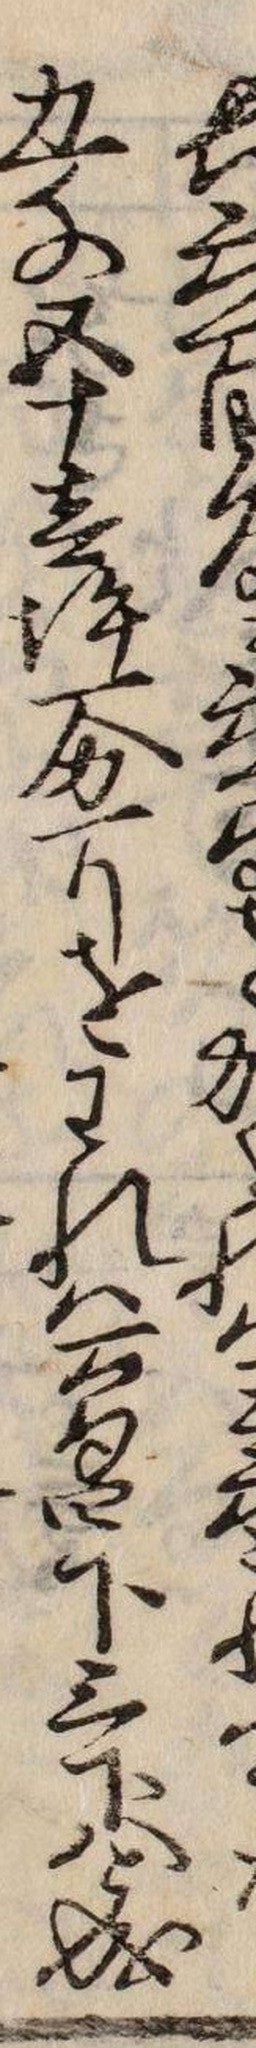五千五十壱坪一分一りをわれは一間四下三下八と成
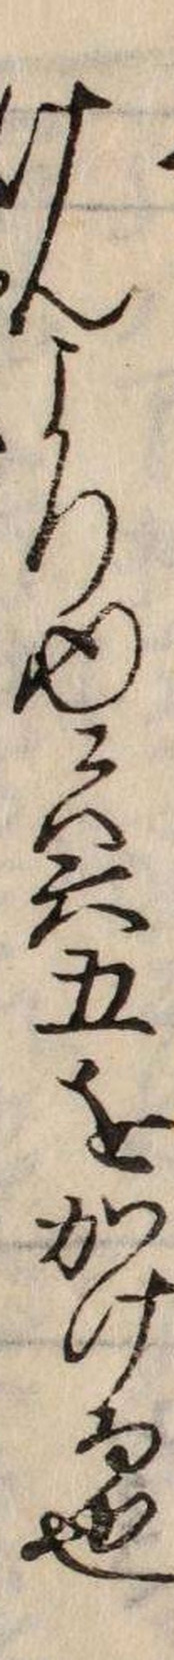けんより内には六五をかける也
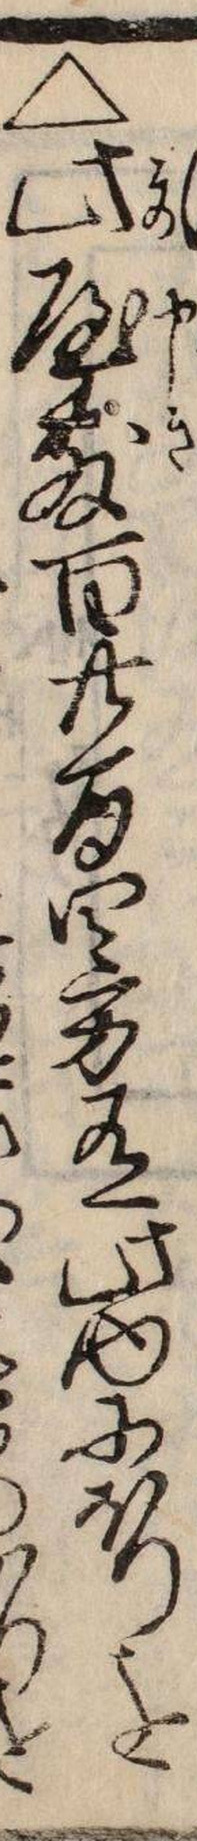△此屋敷百廿万四方有此内にほりを
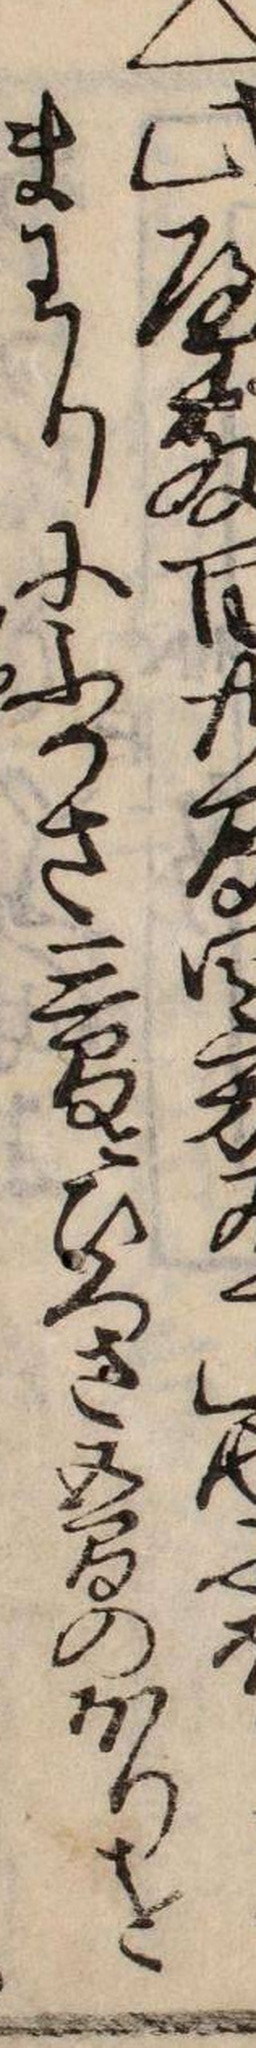まわりにふかさ三間にひろき五間のほりを
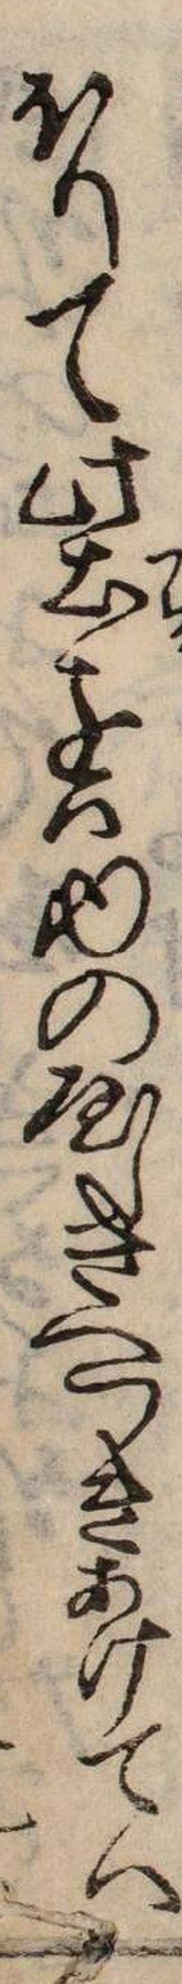ほりて此土をは内のやしきへつきあけては

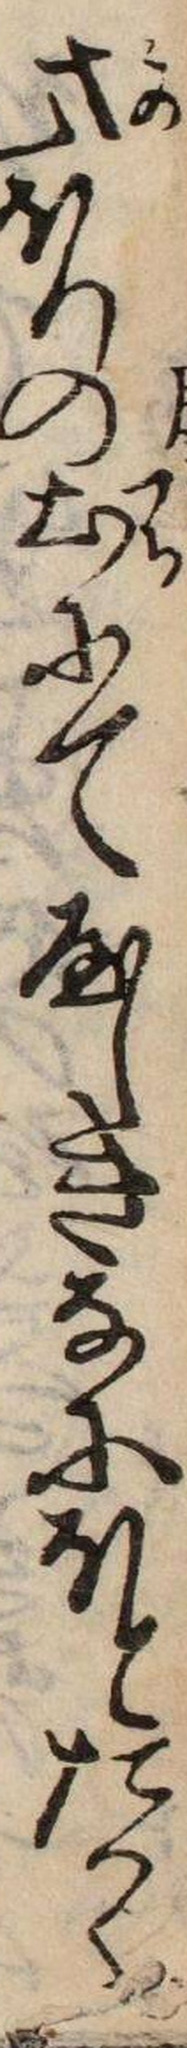此ほりの土にてやしきなにほとたかく
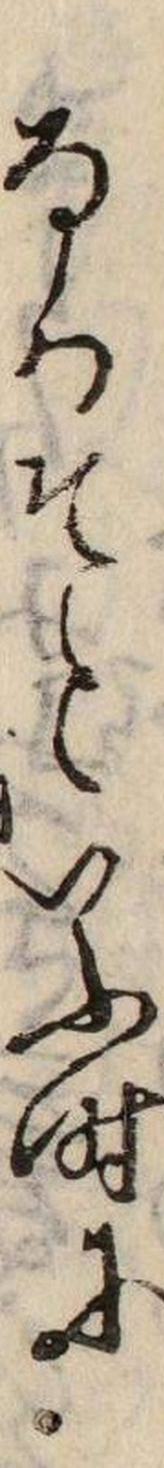なりそといふ時に
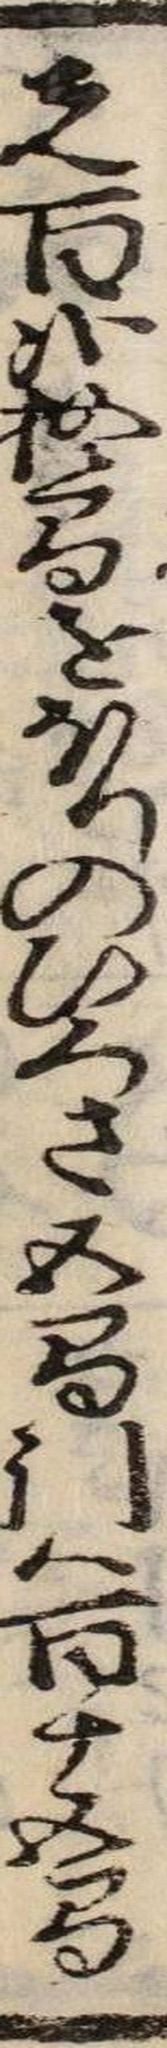先百弐拾間をほりのひろさ五間引は百十五間
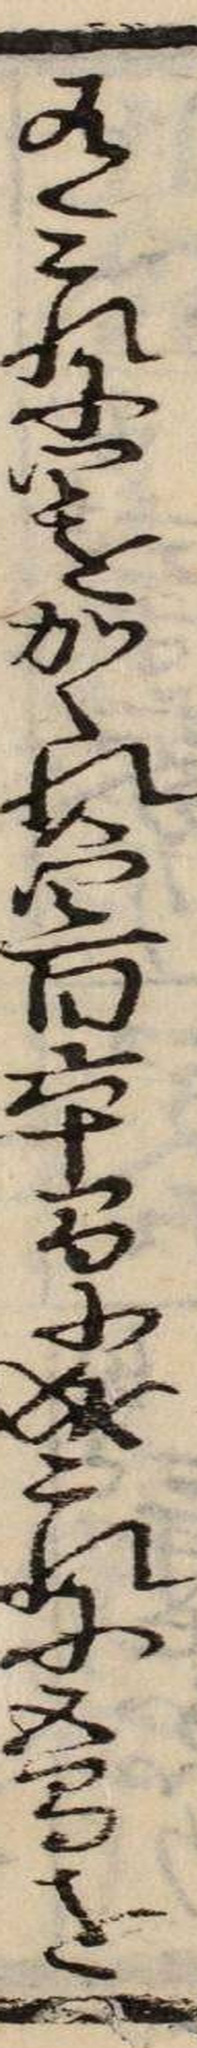有これに四をかくれは四百六十間に成これに五間を
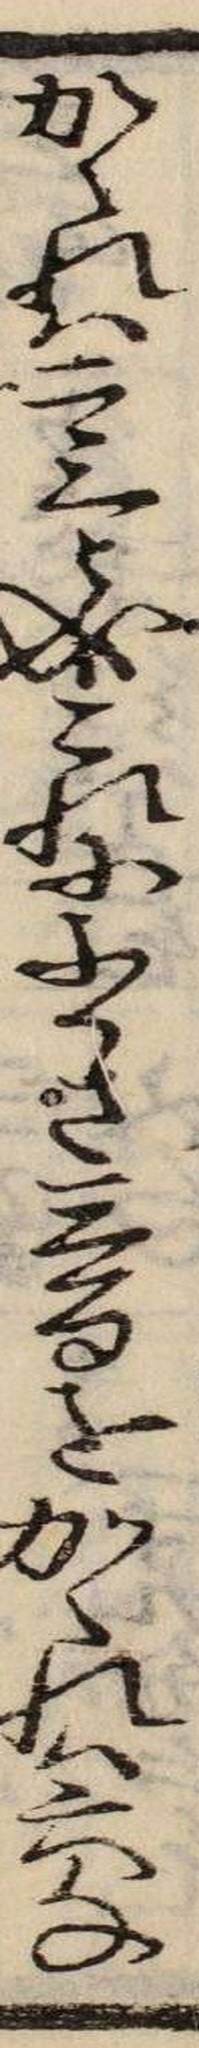かくれは二三と成これにふかさ三間をかくれは六千
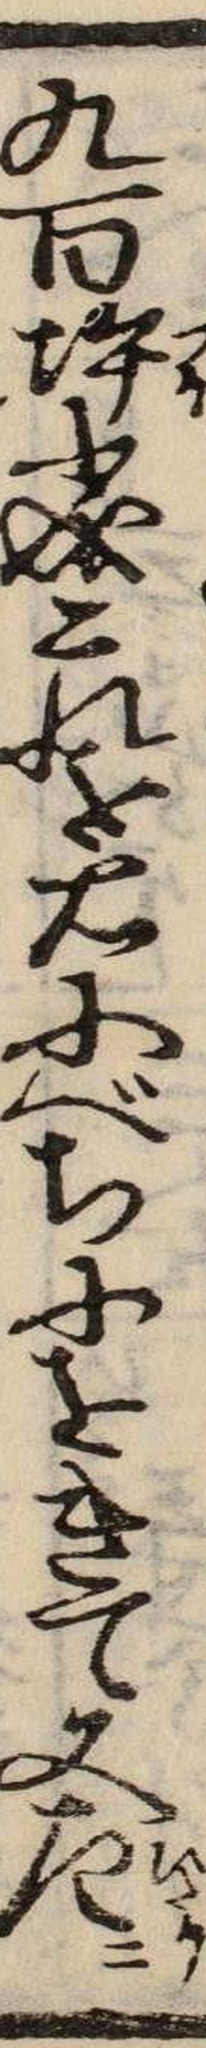九百坪に成これを右にべちにをきて又左に
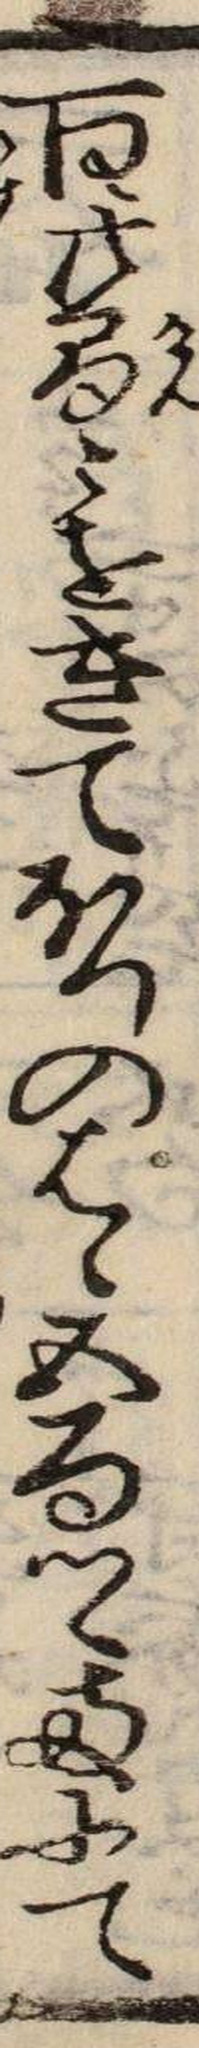百廿間とをきてほりのはは五百つつ両にて
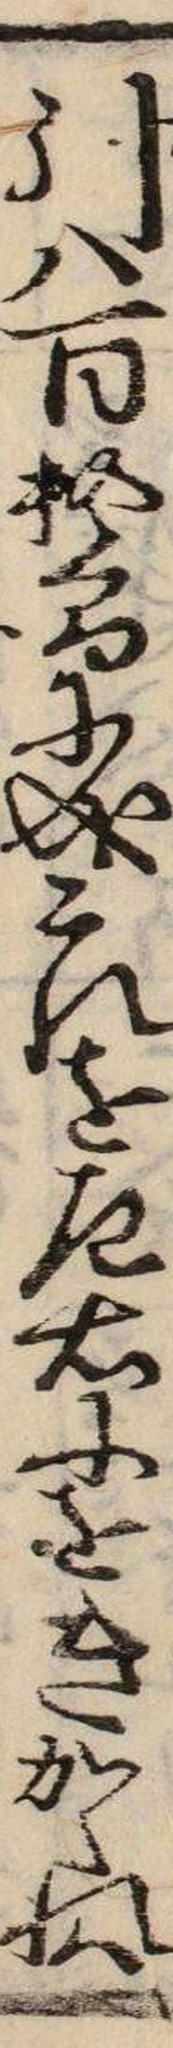引八百拾間に成これを左右にをきかくれは
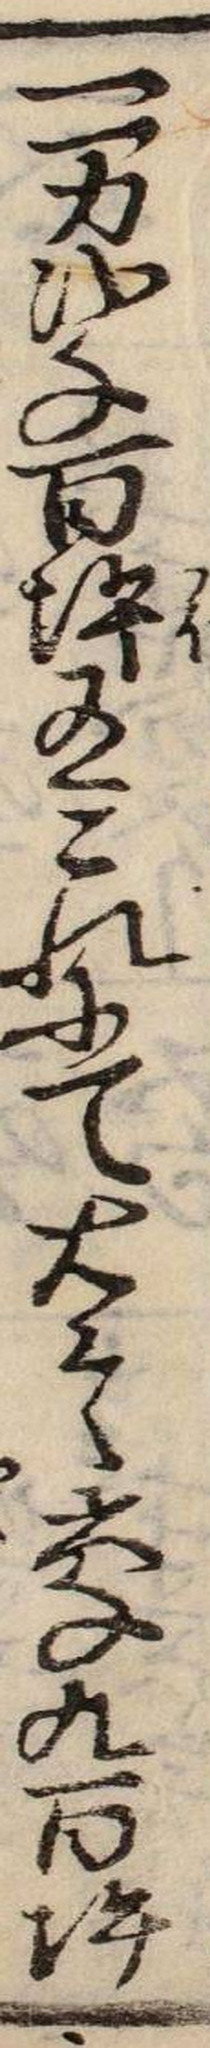一万弐千百坪有これにて右之六千九百坪
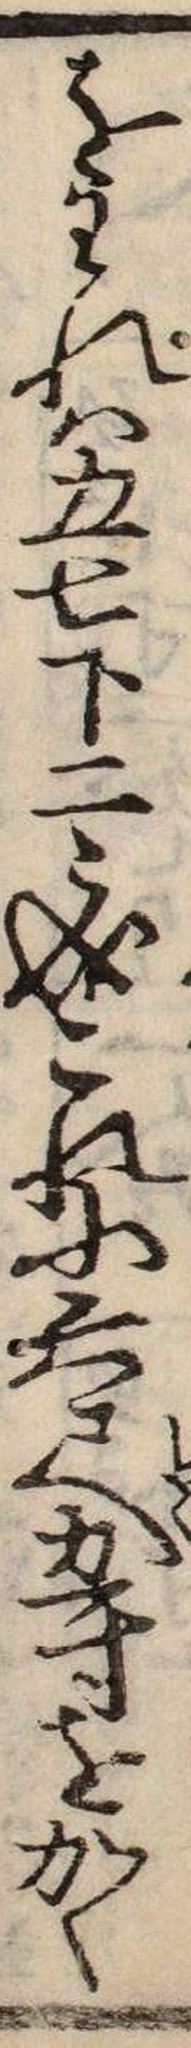をわれは五七下二と成これに六尺五寸をかく
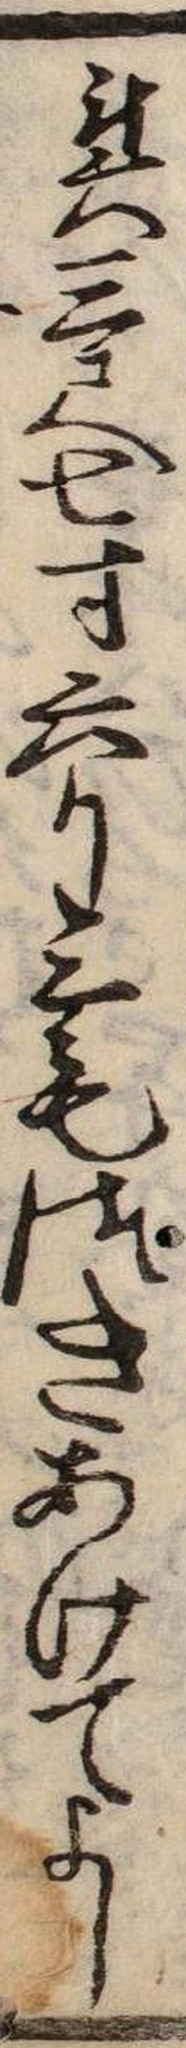れは三尺七寸六り三毛つきあけてよし
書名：塵劫記（寛永11年自跋、京都府立京都学・歴彩館追貴8）
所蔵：京都府立京都学・歴彩館 国文学研究資料館
